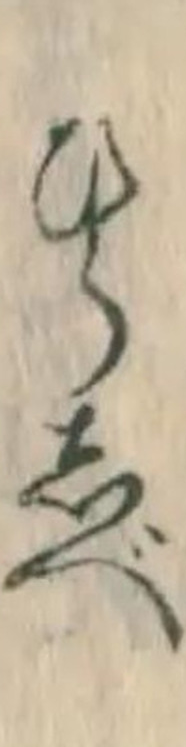ひらしべ
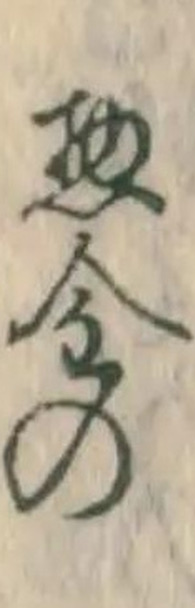惣金の

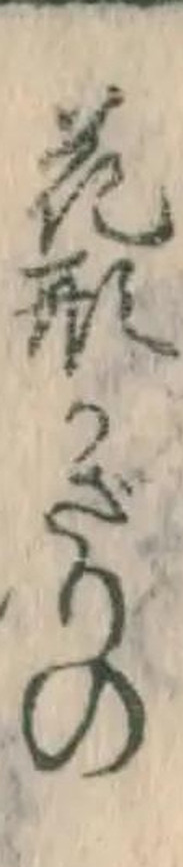花形かざりの
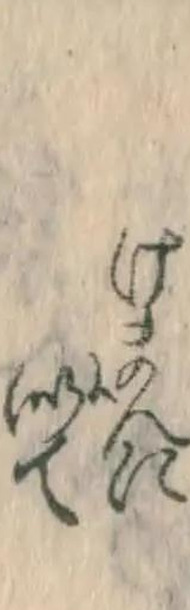けまんに
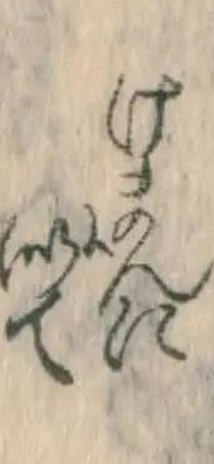けまんに
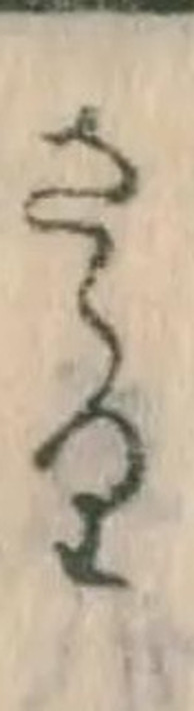さらり
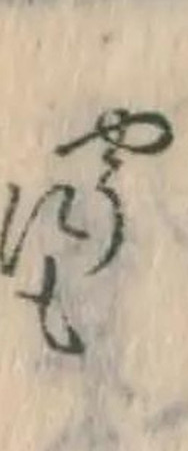やうにも
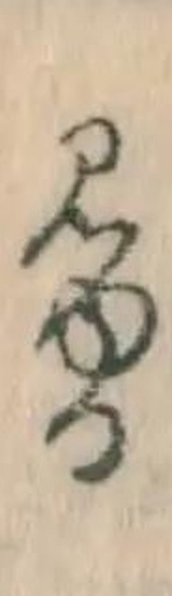見ゆる
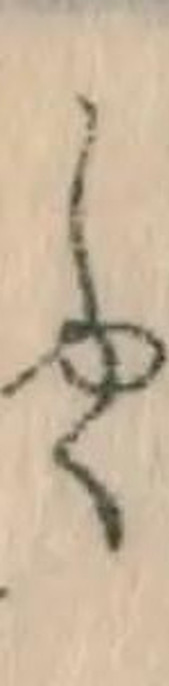しやく
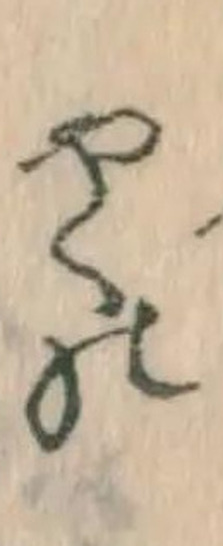やくの
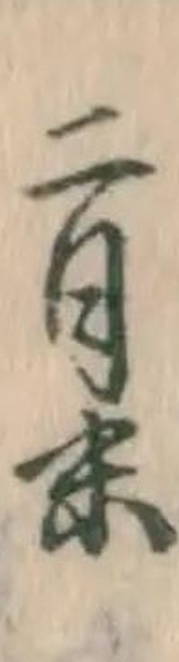二月末
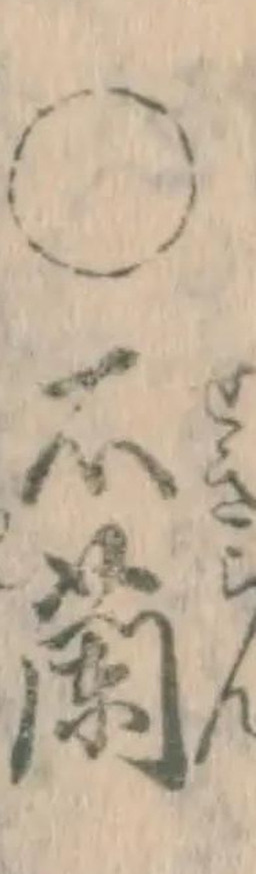〇石蘭
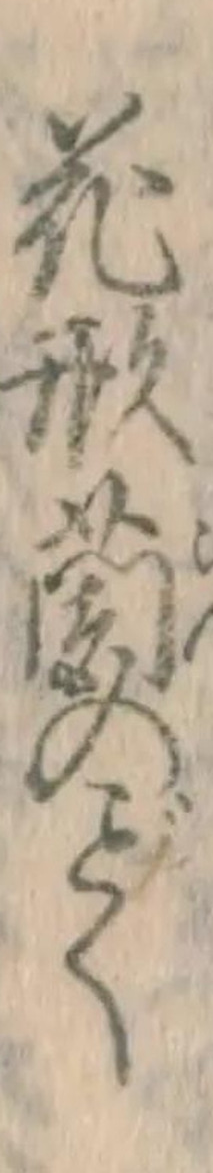花形蘭のごとく
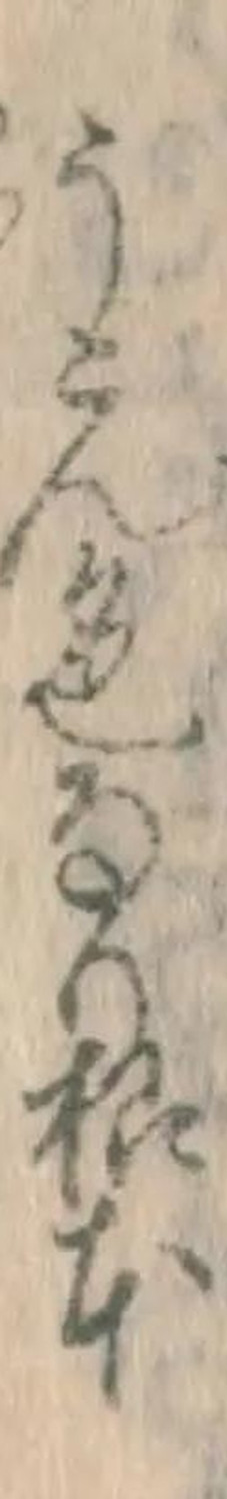うこん色なり根本
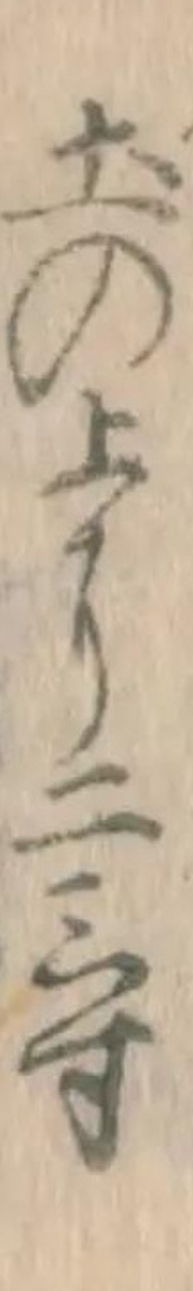土の上に二三寸
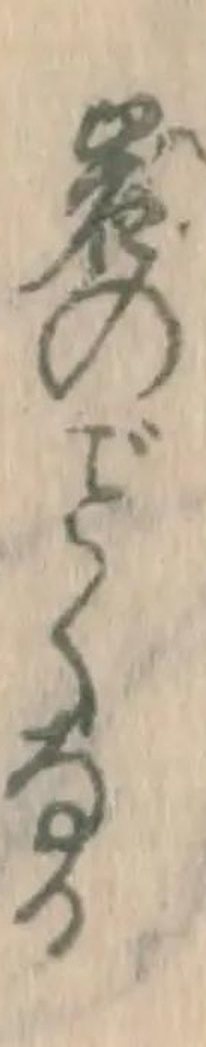岩のごとくなり
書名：艸花繪前集. [1]
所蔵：国立国会図書館 National Diet Library, JAPAN
